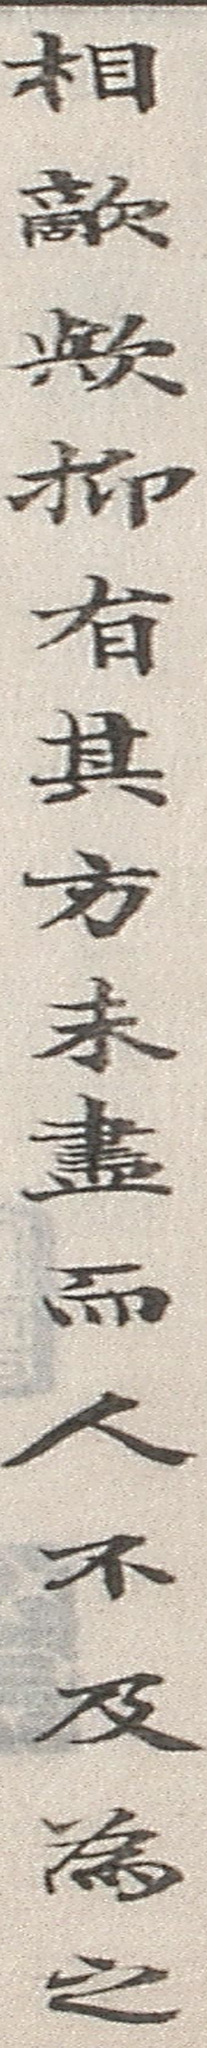相敵歟抑有其方未尽而人不及為之
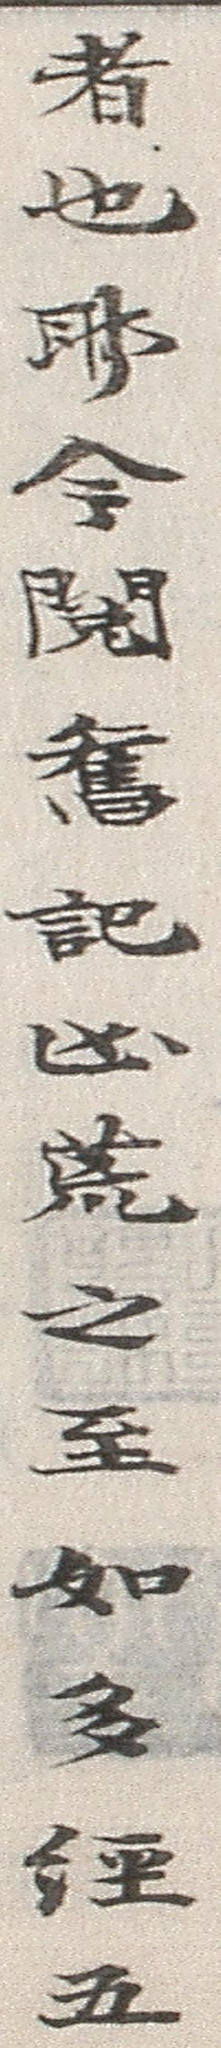者也耶今閲舊記凶荒之至如多経五
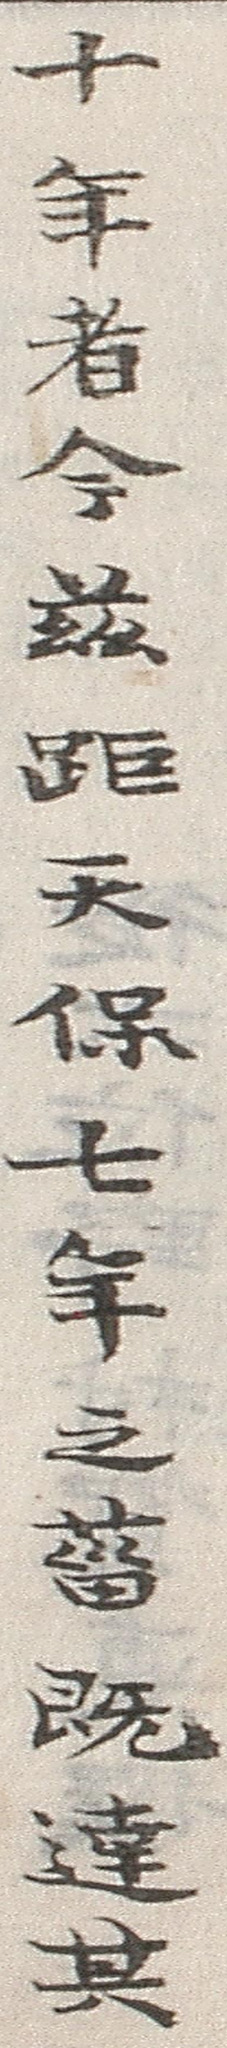十年者今玆距天保七年之災既達其
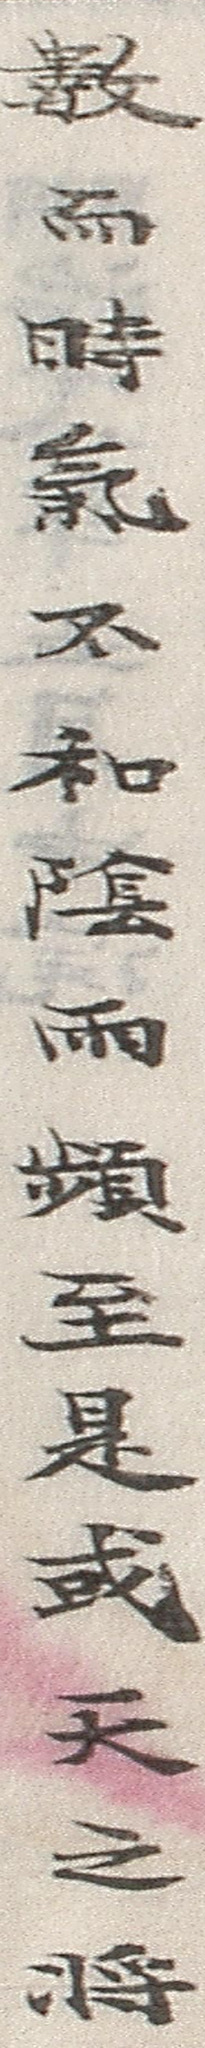数而時気不和陰雨頻至是或天之将
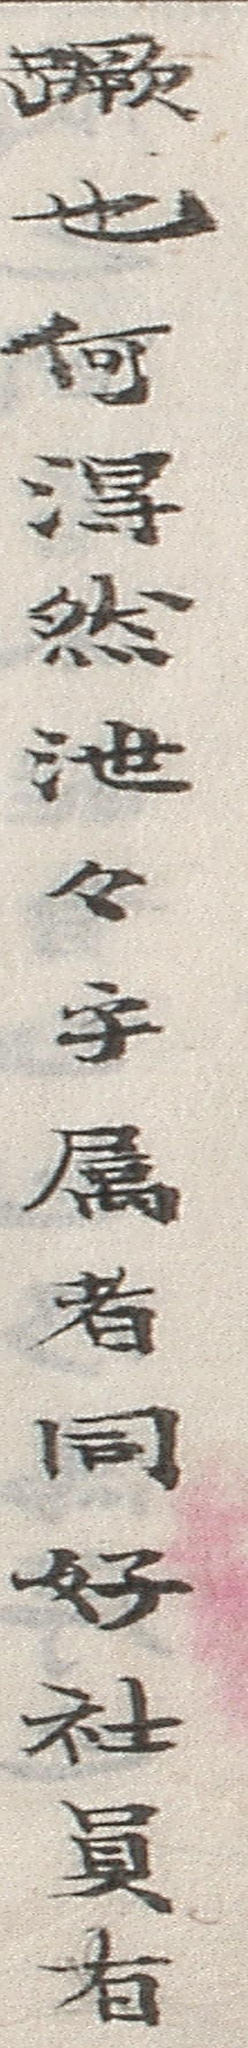蹶也何得然泄々乎属者同好社員有
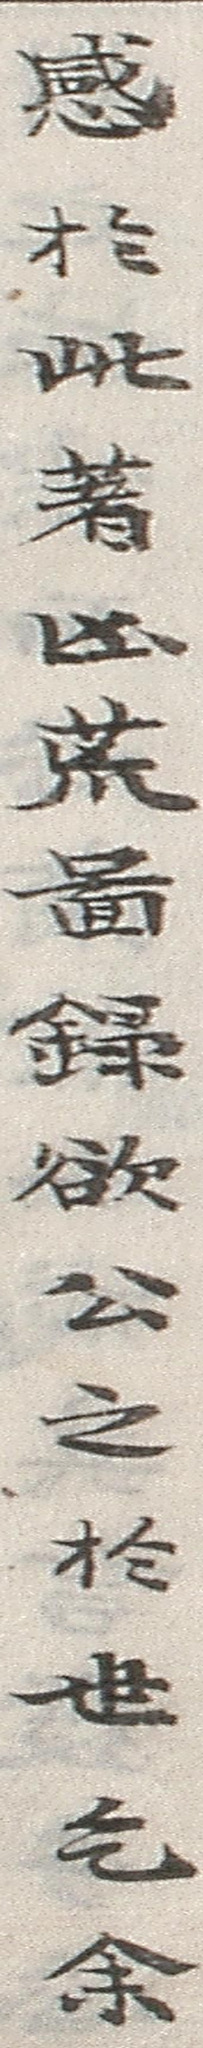感於此著凶荒図録欲公之於世乞余
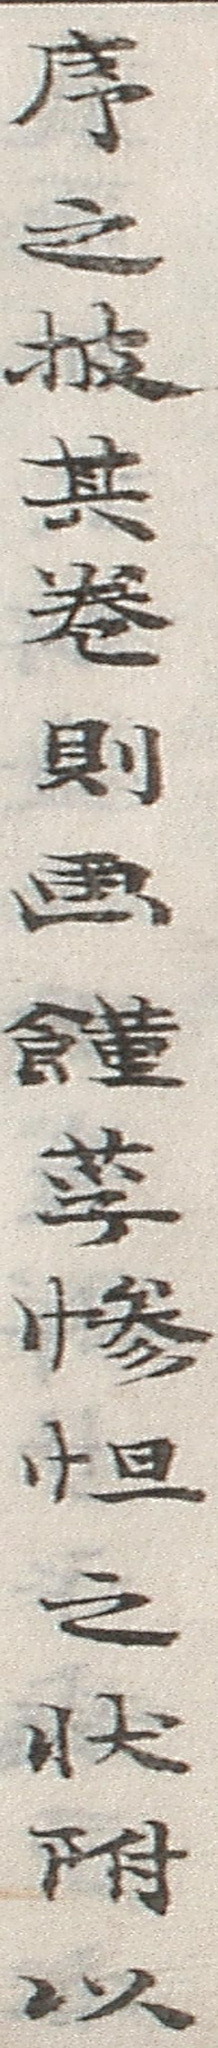序之披其巻則画饉莩惨怛之状附以
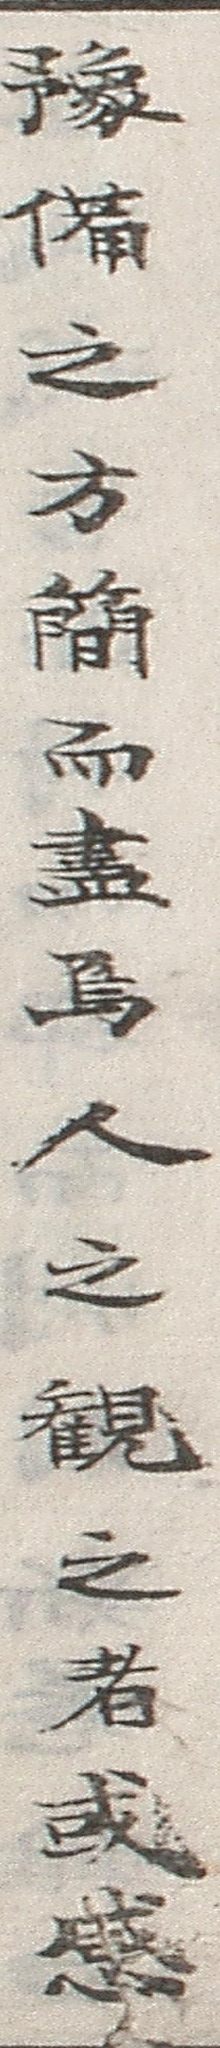豫備之方簡而尽焉人之観之者或感

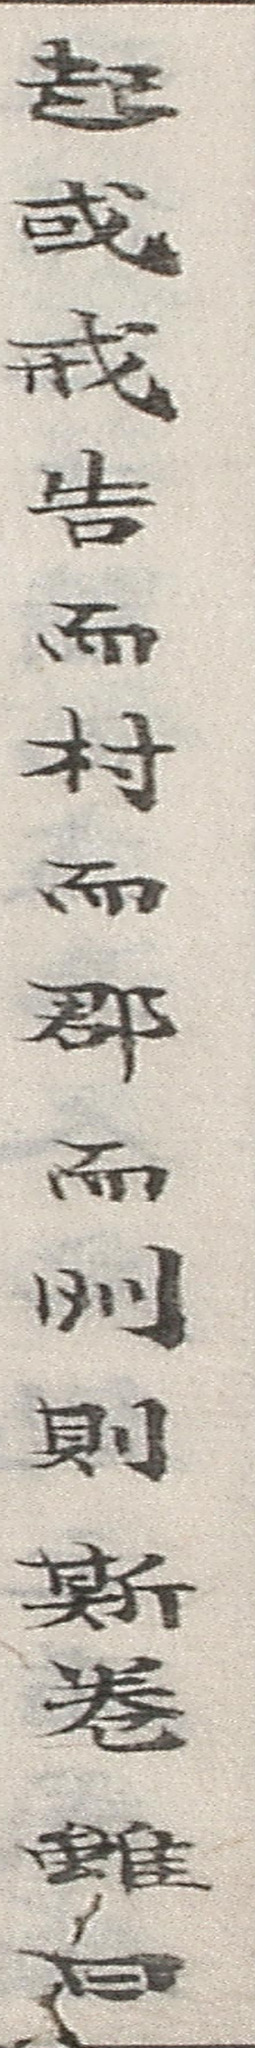起或戒告而村而郡而洲則斯巻雖曰
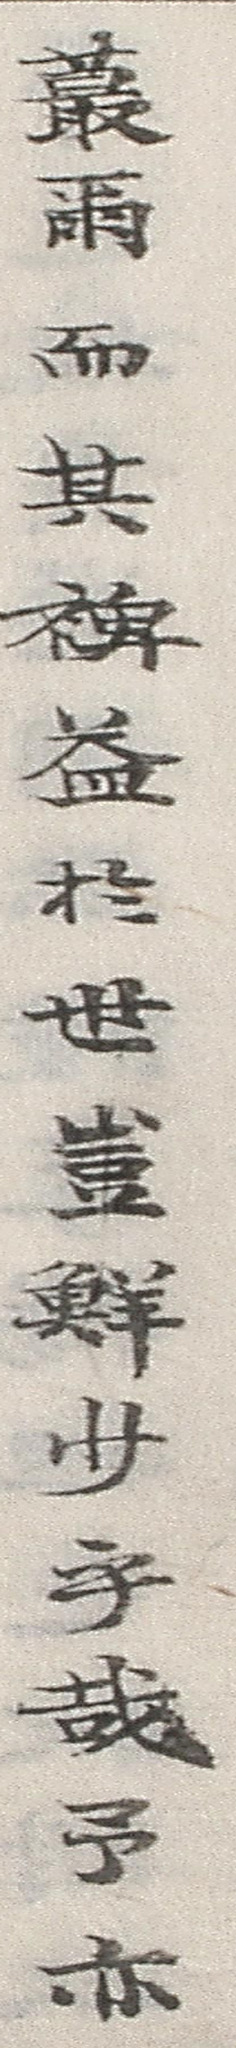蕞爾而其裨益於世豈鮮少乎哉予亦
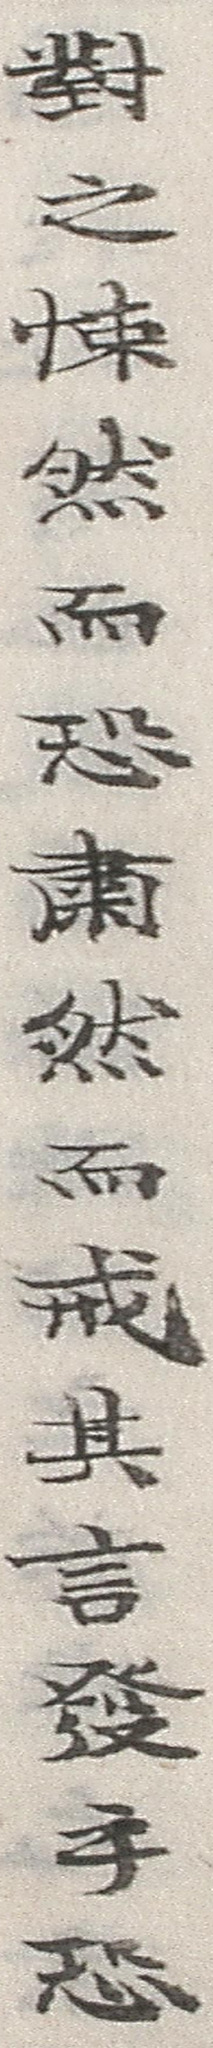対之悚然而恐粛然而戒其言発乎恐
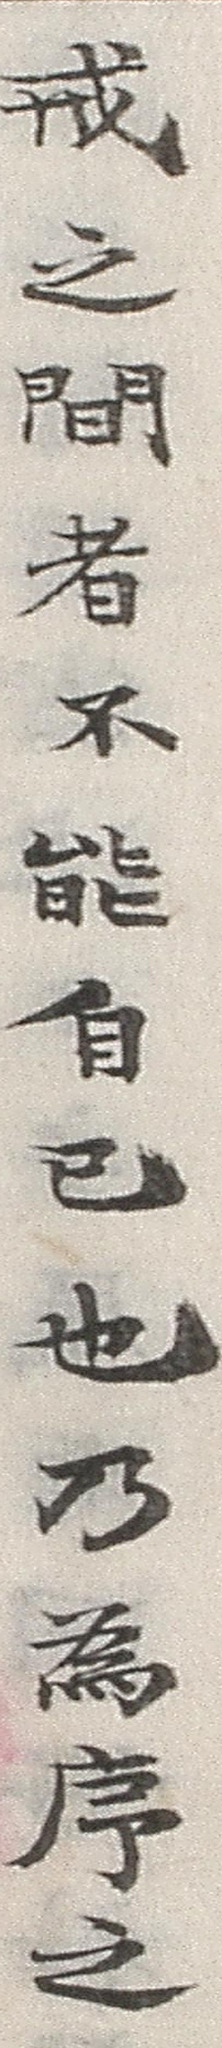戒之間者不能自已也乃為序之
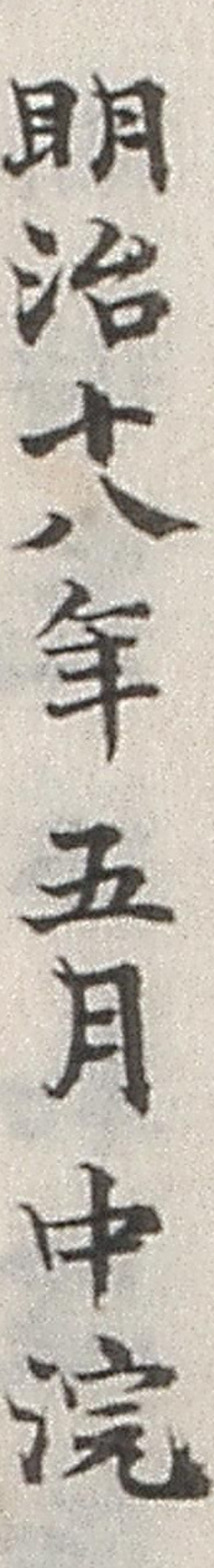明治十八年五月中浣
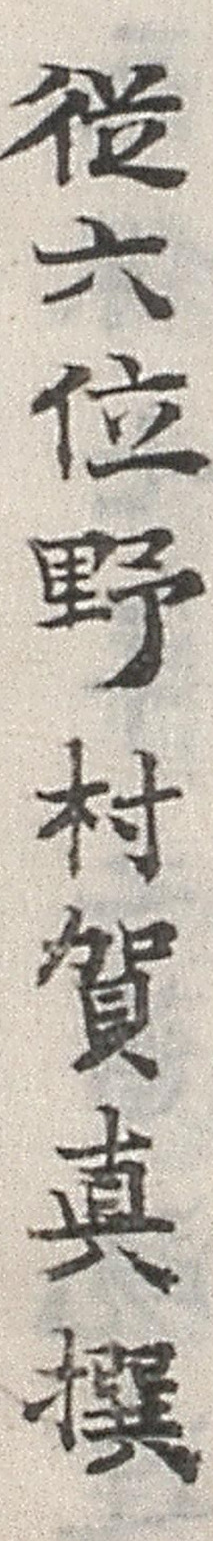従六位野村賀真撰
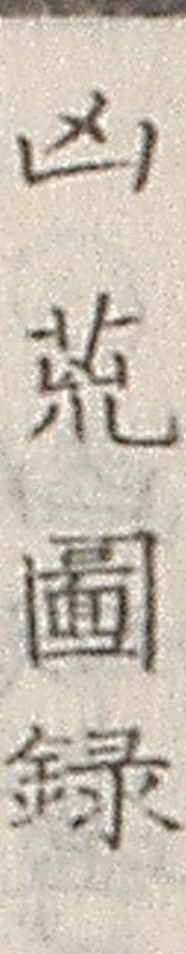凶荒図録
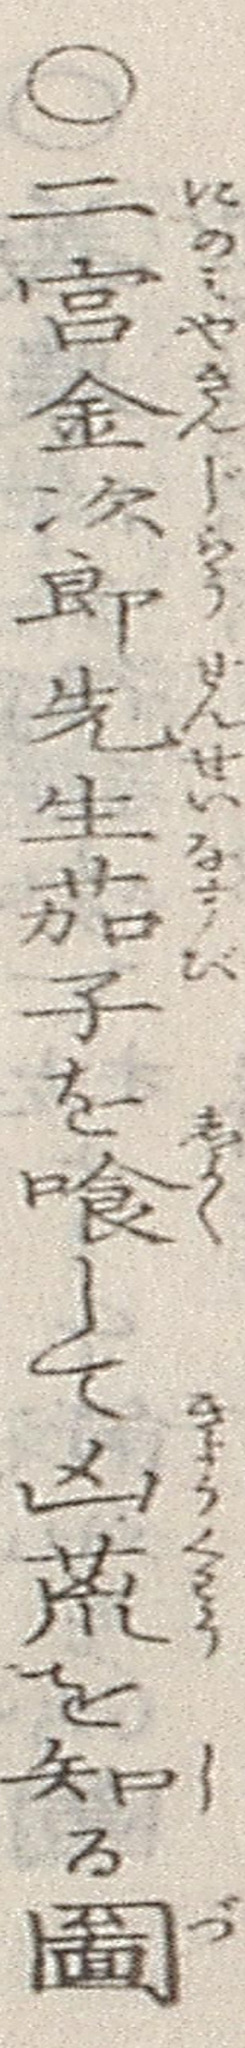〇二宮金次郎先生茄子を喰して凶荒を知る図
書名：凶荒図録　完
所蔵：東京大学地震研究所図書室 Earthquake Research Institute Library, The University of Tokyo, JAPAN
